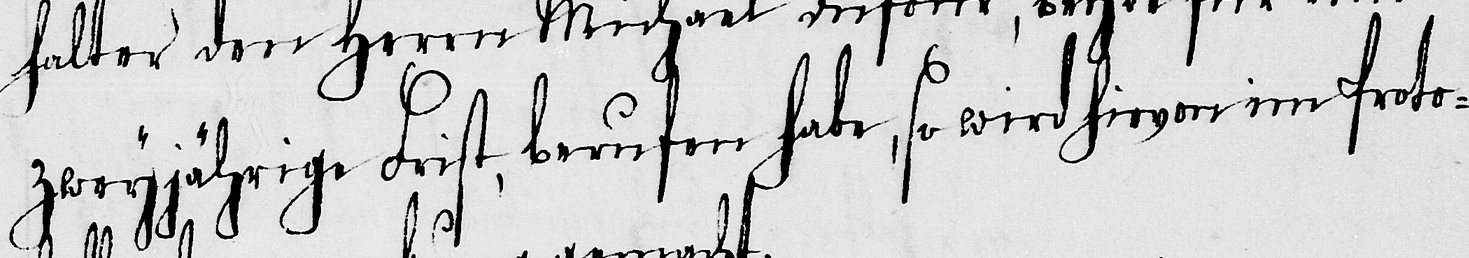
zweyjährige Frist, berufen habe, so wird hievon im Pro¬
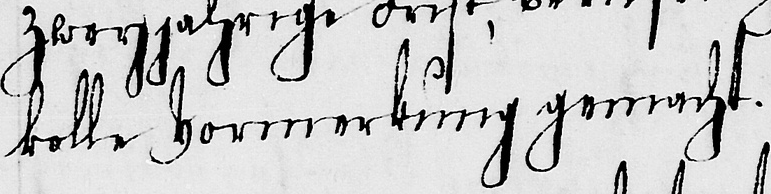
kolle Vormerkung gemacht.
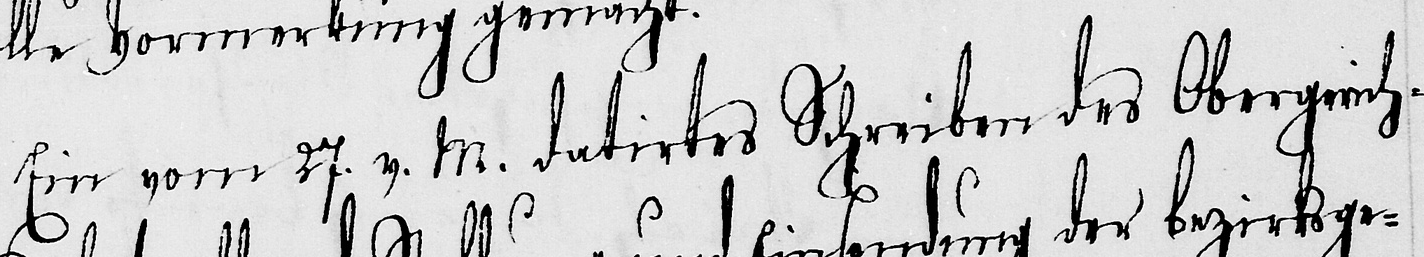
Ein vom 27. v. M. datirtes Schreiben des Obergerich¬
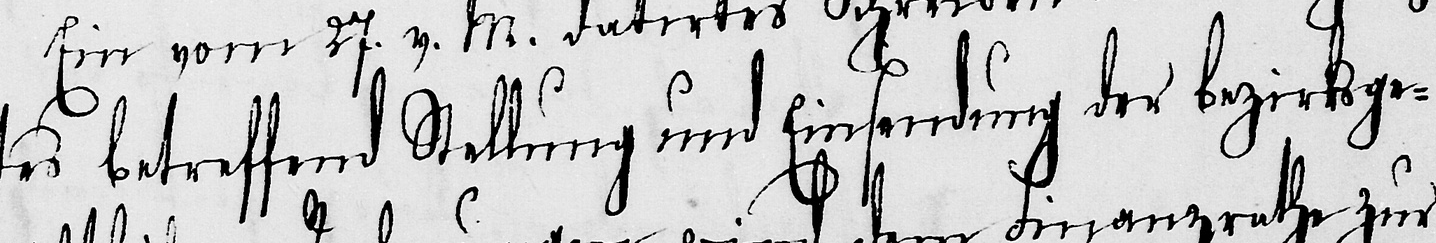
tes betreffend Stellung und Einsendung der bezirksge¬
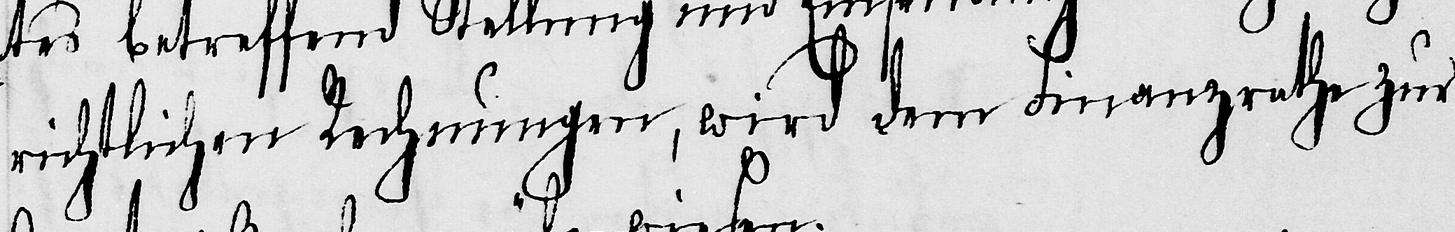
richtlichen Rechnungen, wird dem Finanzrathe zur
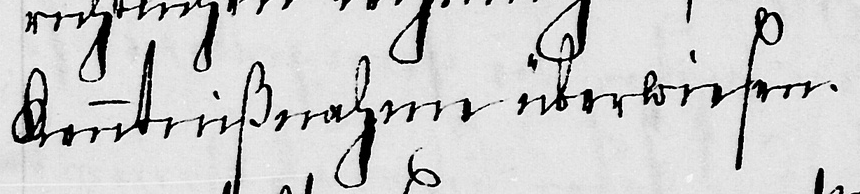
Kenntnißnahme überwiesen.
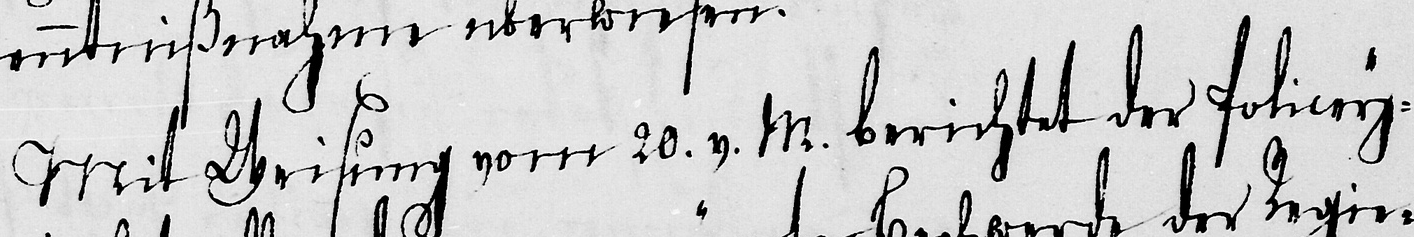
Mit Weisung vom 20. v. M. berichtet der Policey¬
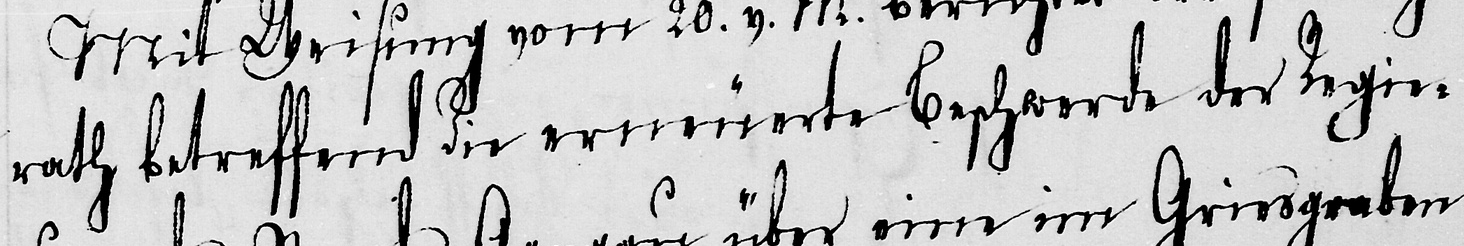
rath betreffend die erneuerte Beschwerde der Regie¬
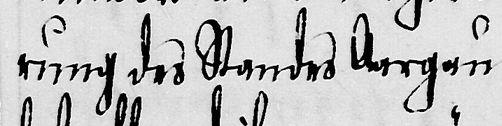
rung des Standes Aargau
